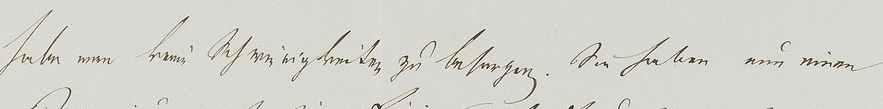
habe man keine Schwierigkeiten zu besorgen. Sie haben nun einen
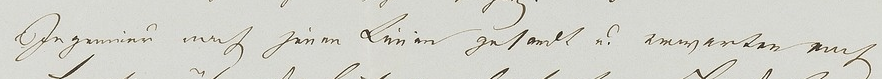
Ingenieur nach jenen Linien gesandt u. erwarten noch
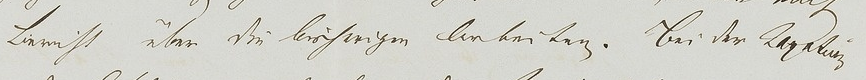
Bericht über die bisherigen Arbeiten. Bei der Taxation
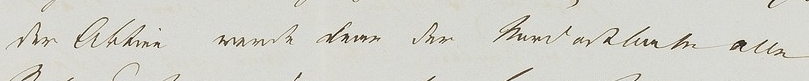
der Aktien werde man der Nordostbahn alle
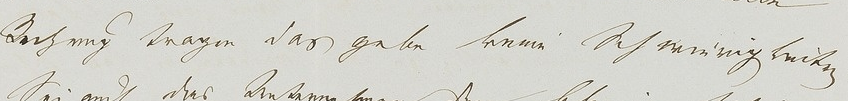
Rechnung tragen das gebe keine Schwierigkeiten.
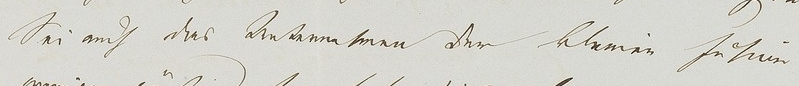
Sei auch das Unternehmen der kleinen Fusion
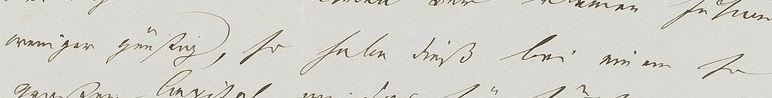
weniger günstig, so habe dieß bei einem so
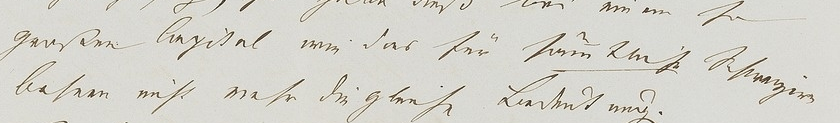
großen Capital wie das für sämmtliche Schweizer
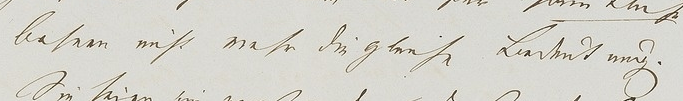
Bahnen nicht mehr die gleiche Bedeutung.
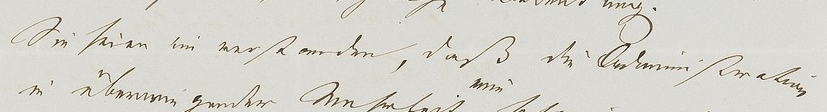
Sie seien einverstanden, daß die Administration
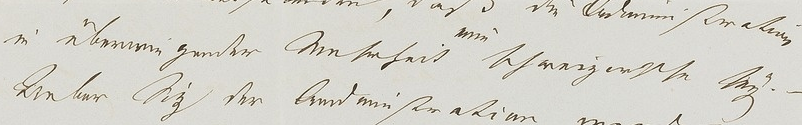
in überwiegender Mehrheit eine schweizerische sey. –
